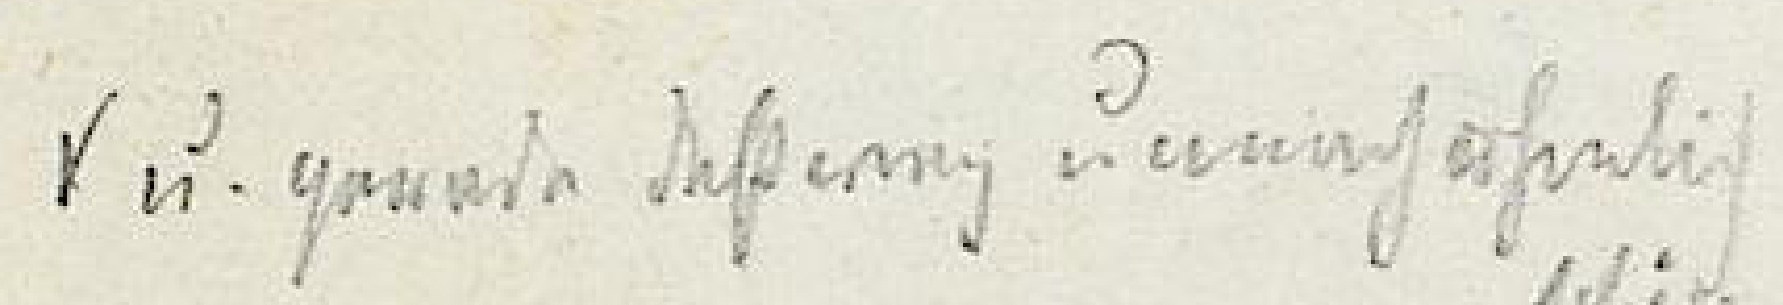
u. gerade deßweg unnachahmlich
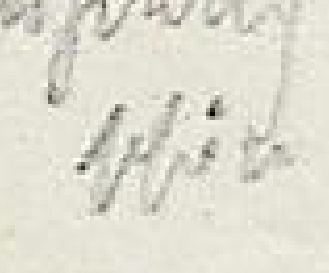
schön
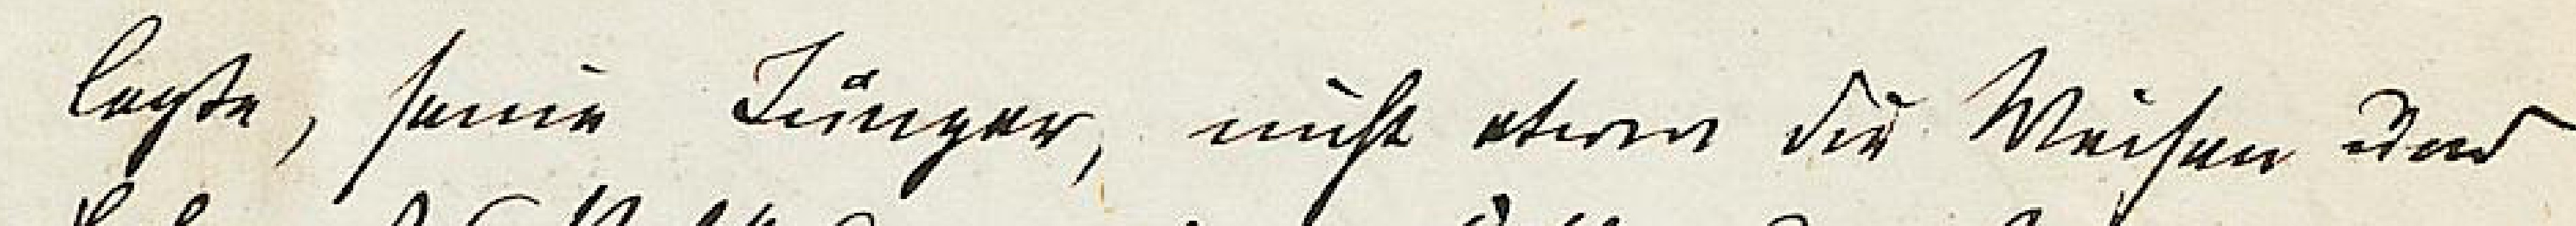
legte, seine Jünger, nicht etwa die Weisen und
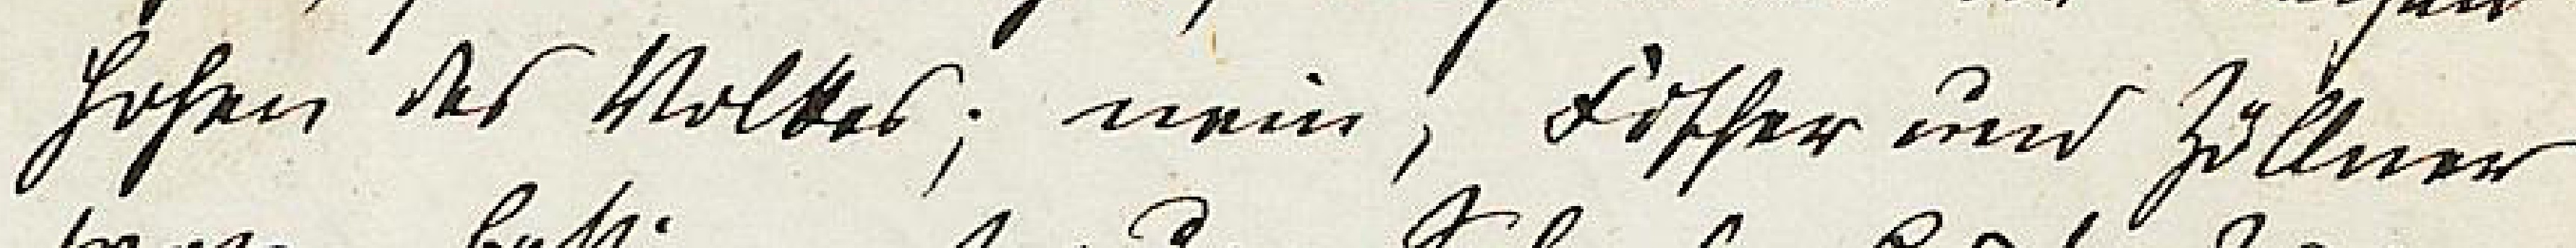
Hohen des Volkes; nein, Fischer und Zöllner
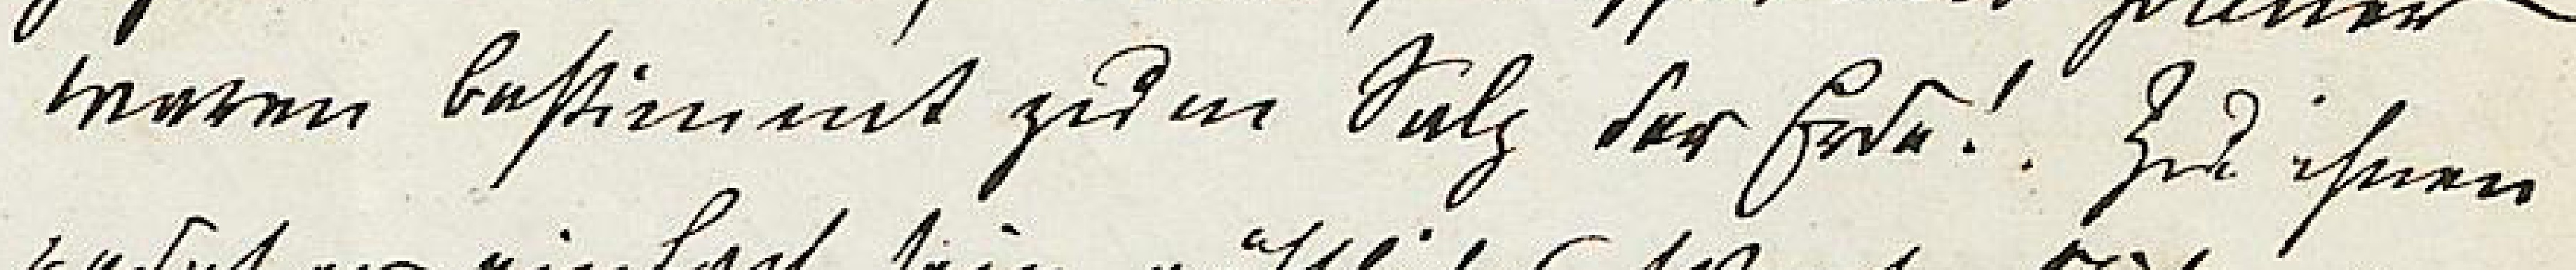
waren bestimmt zum Salz der Erde!. Zu ihnen
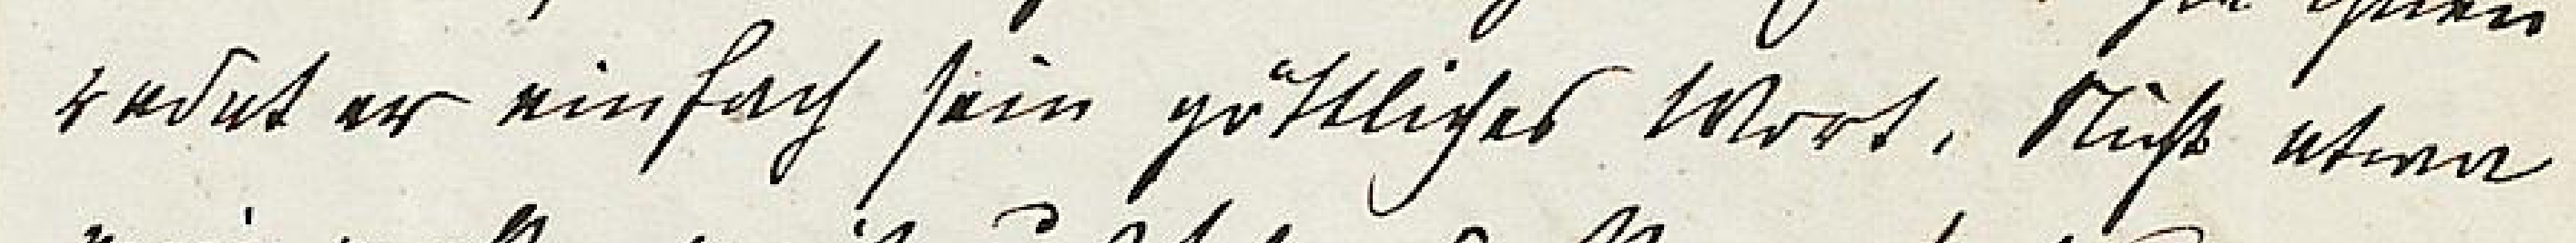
redet er einfach sein göttliches Wort. Nicht etwa
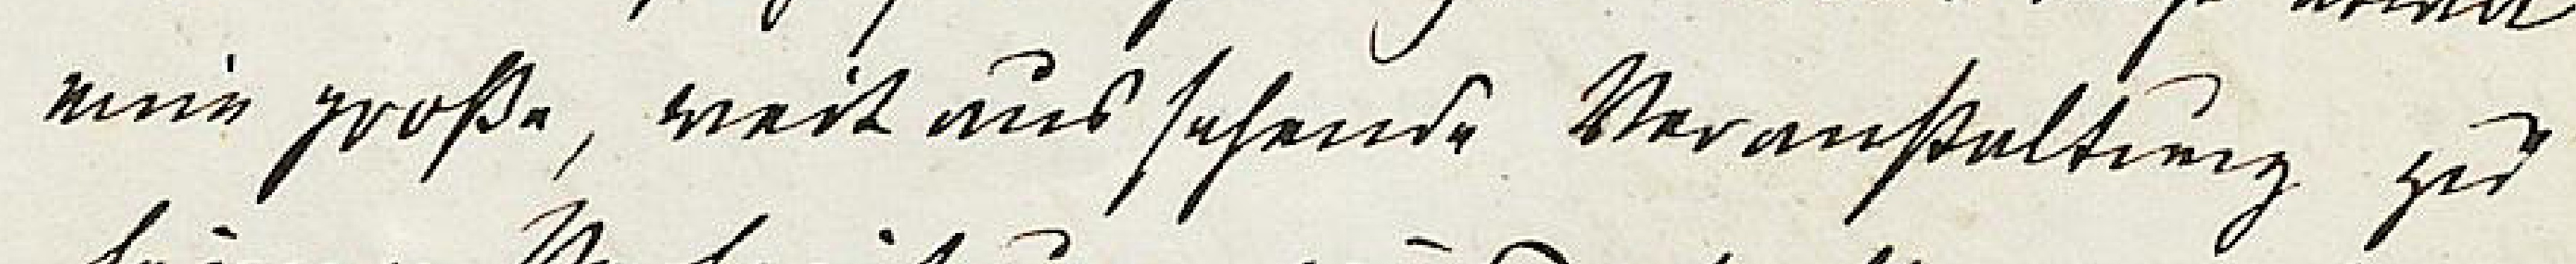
eine große, weitaussehende Veranstaltung zu
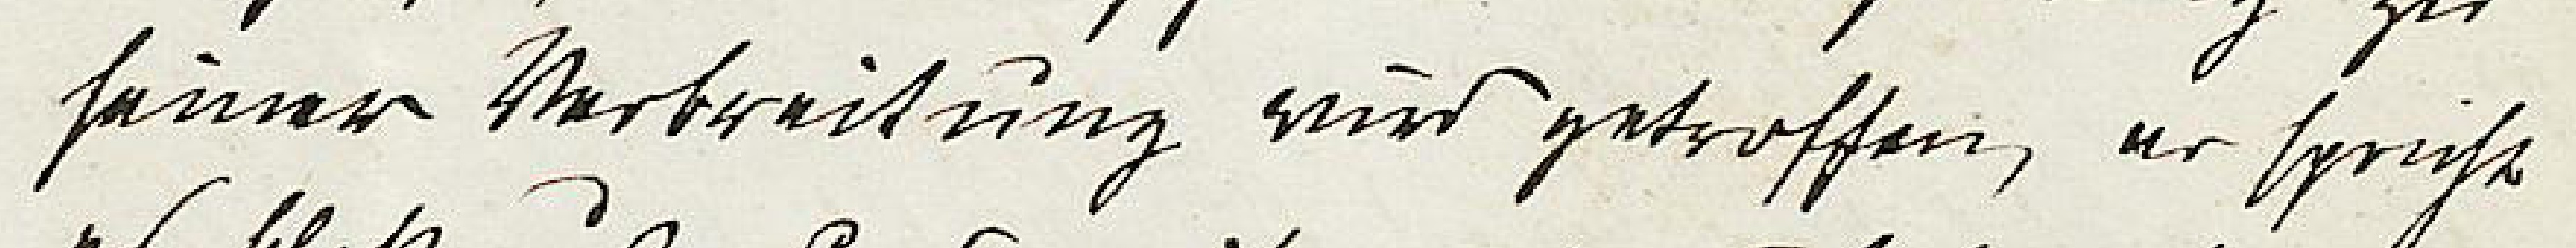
seiner Verbreitung wird getroffen, er spricht
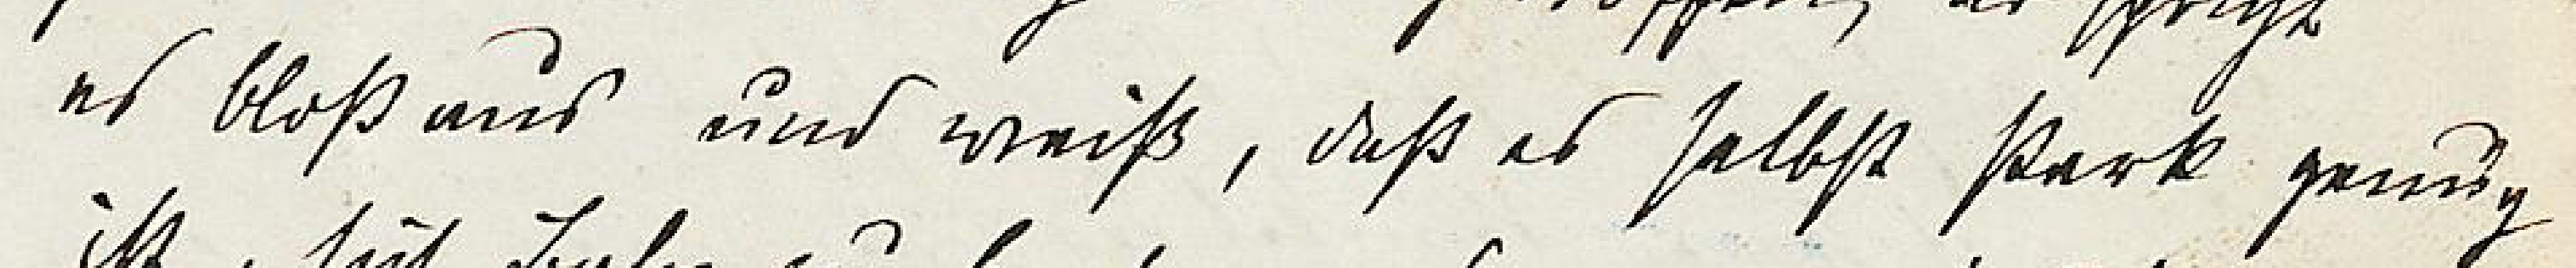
es bloß aus und weiß, daß er selbst stark genug
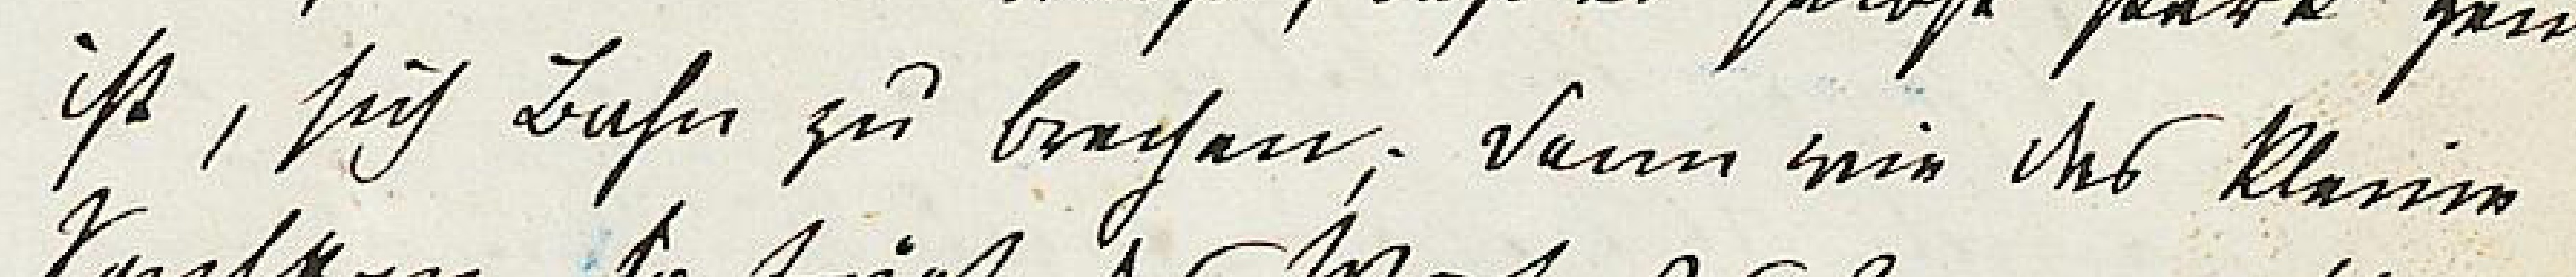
ist, sich Bahn zu brechen. Denn wie das kleine
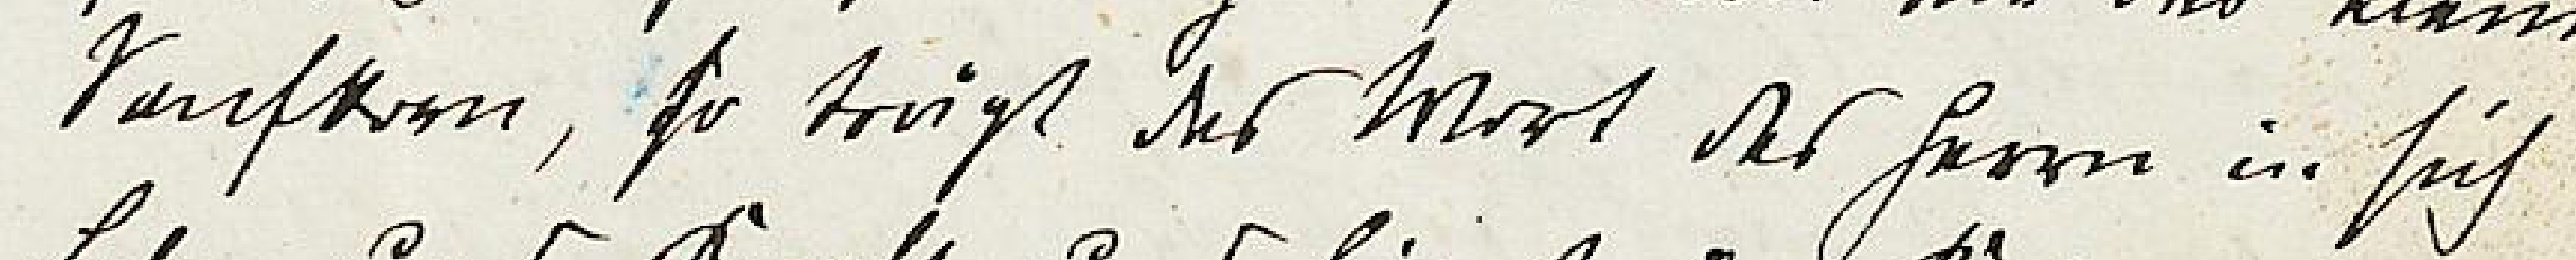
Senfkorn, so trägt das Wort des Herrn in sich
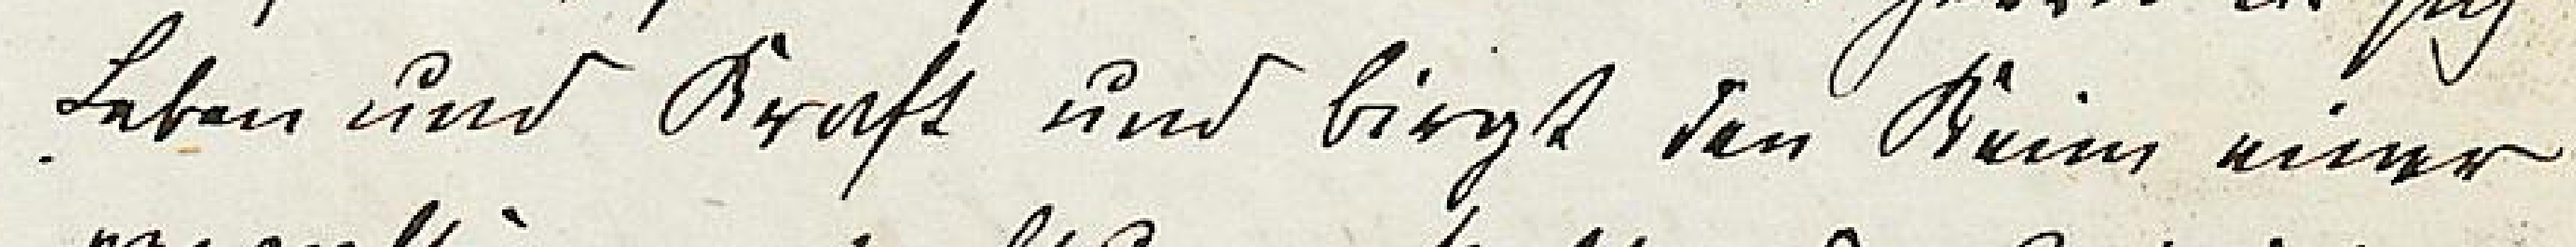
Leben und Kraft und birgt den Keim einer
